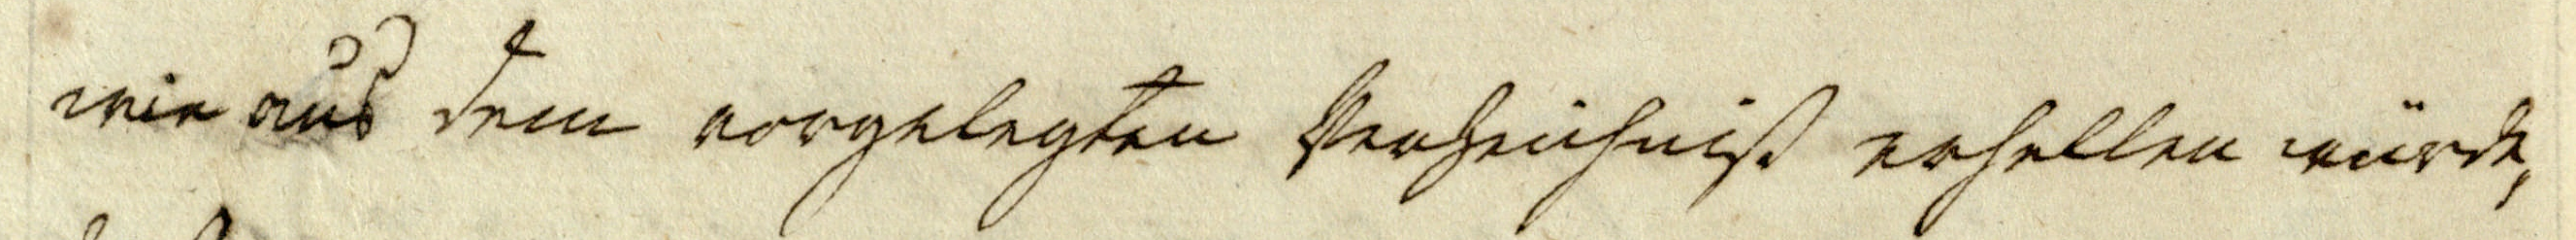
wie aus dem vorgelegten Verzeichniß erhellen würde,
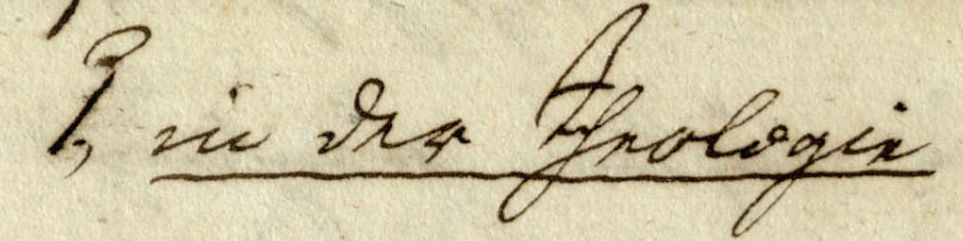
I., in der Theologie
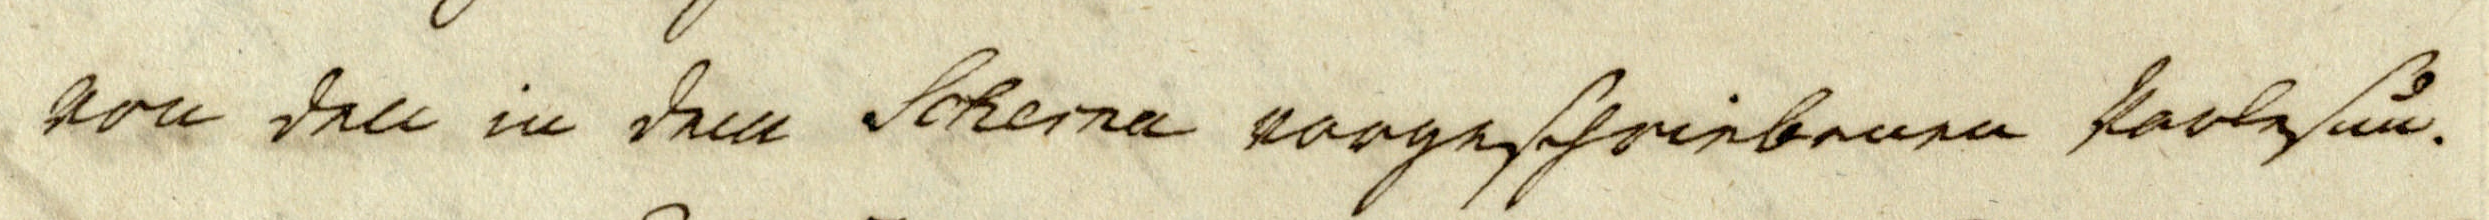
von den in dem Schema vorgeschriebenen Vorlesun¬
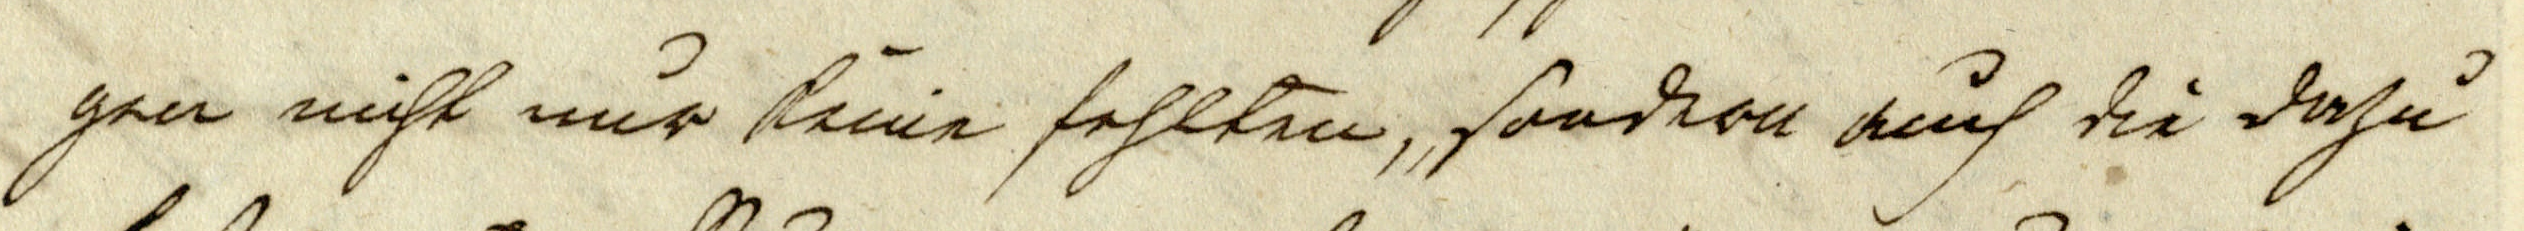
gen nicht nur keine fehlten, sondern auch die dazu
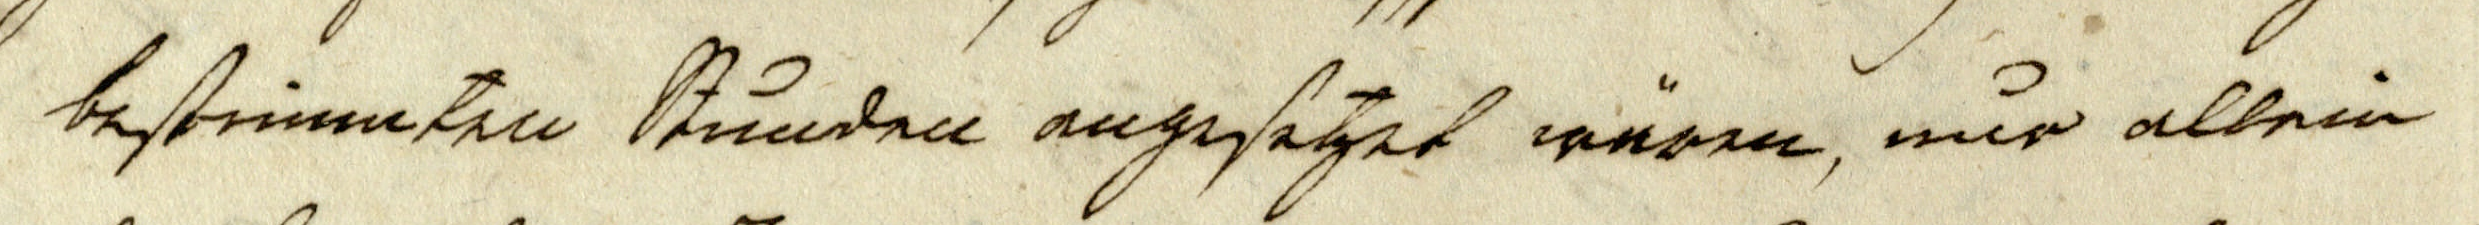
bestimmten Stunden angesetzet wären, nur allein
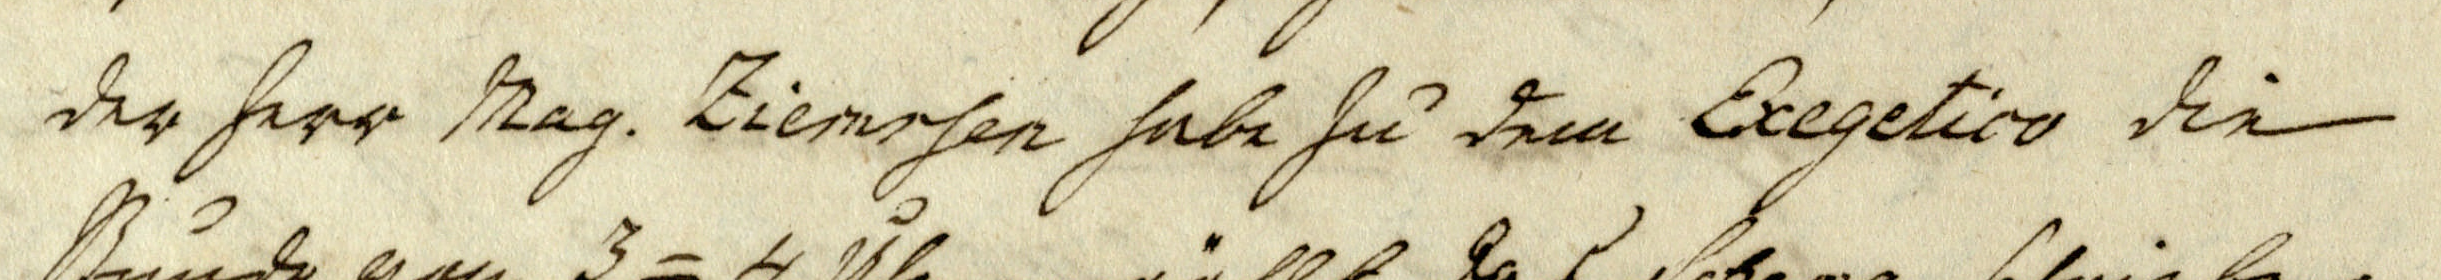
der herr Mag. Ziemssen habe zu dem Exegetico die
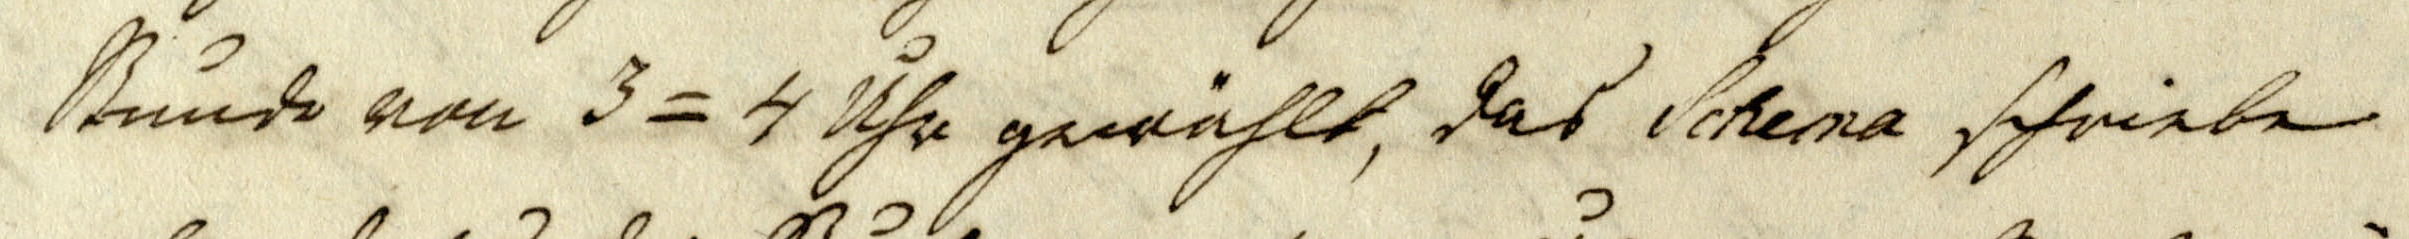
Stunde von 3-4 Uhr gewählt, das Schema schriebe
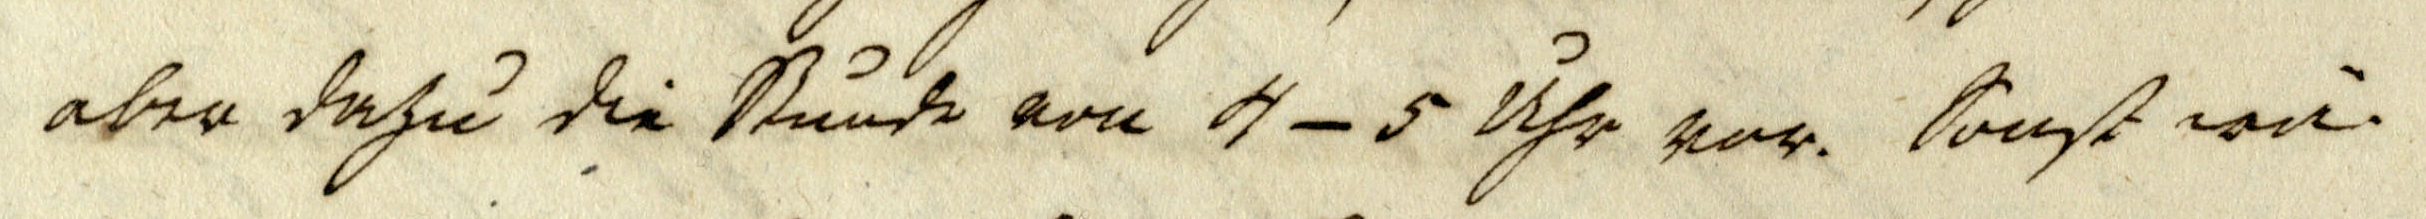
aber dazu die Stunde von 4-5 Uhr vor. Sonst wä¬
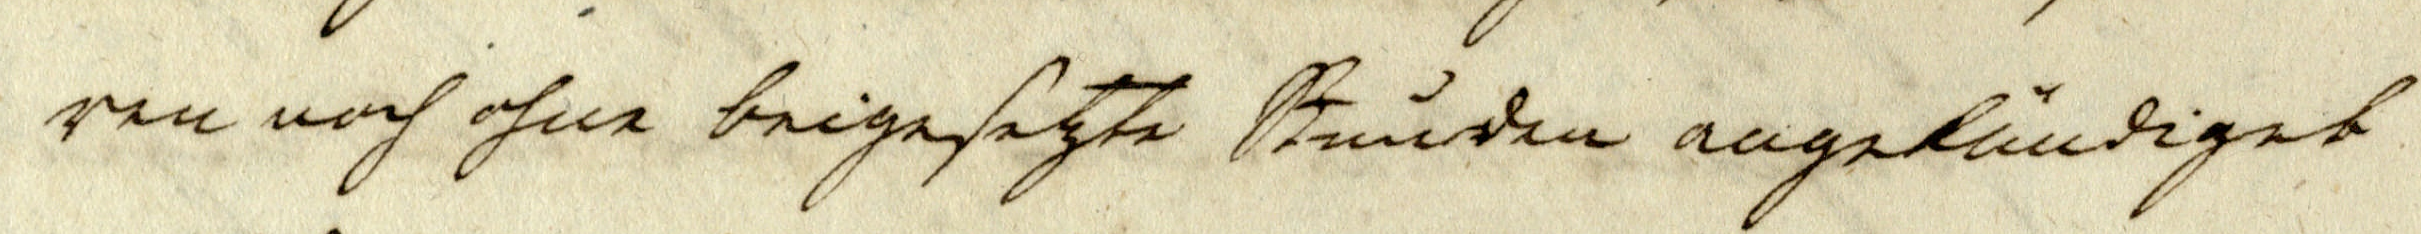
ren noch ohne beigesetzte Stunden angekündiget
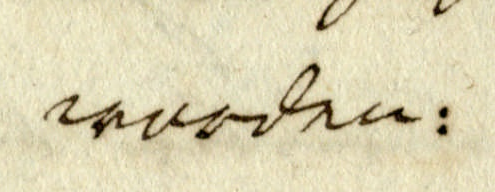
worden:
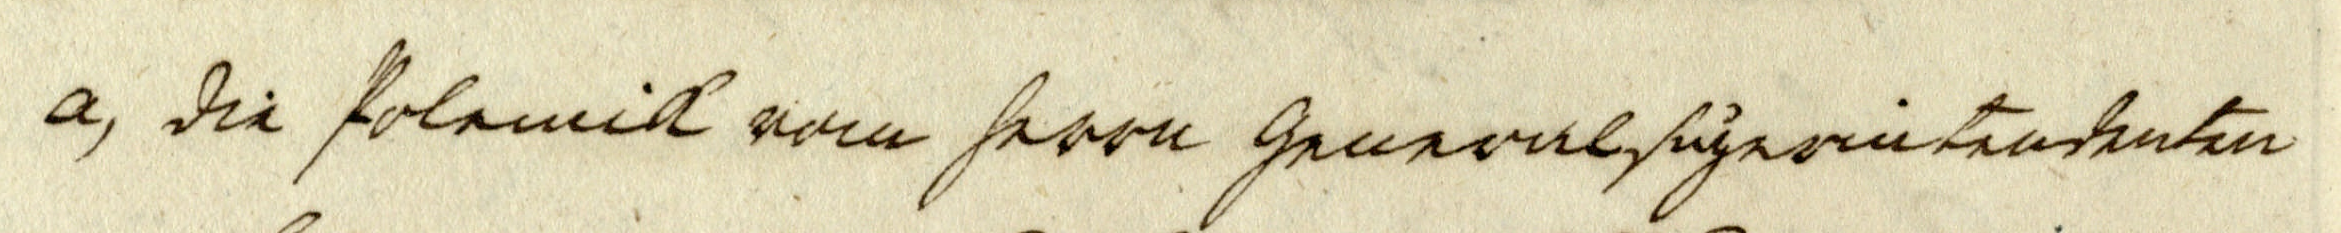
a, die Polemik vom herrn Generalsuperintendenten
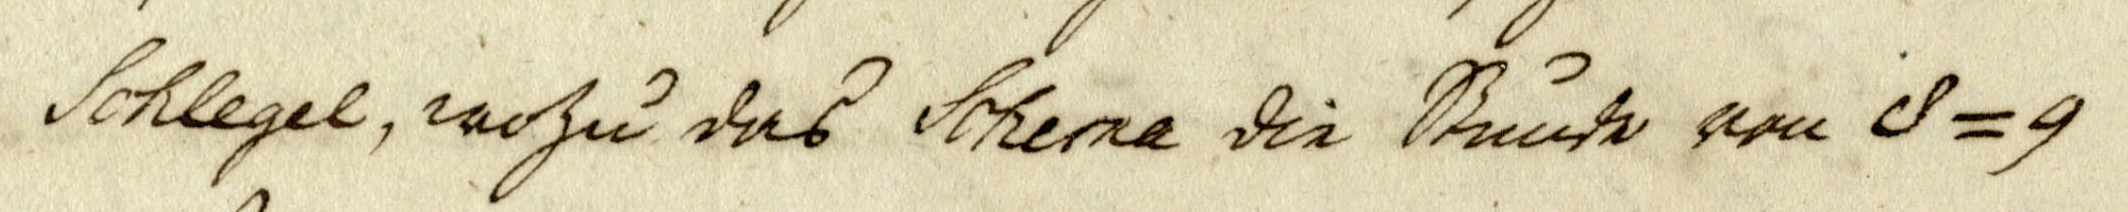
Schlegel, wozu das Schema die Stunde von 8-9
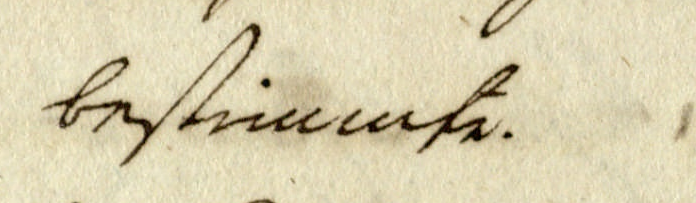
bestimmte.
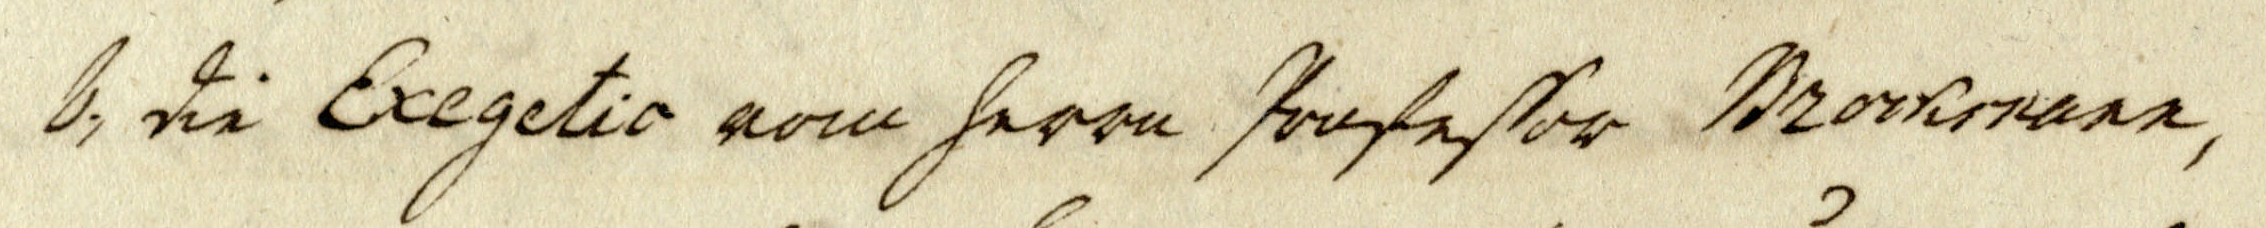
b. die Exegetic vom herrn Professor Brockmann,
